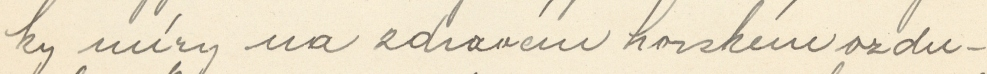ky míry na zdravém horském vzdu-
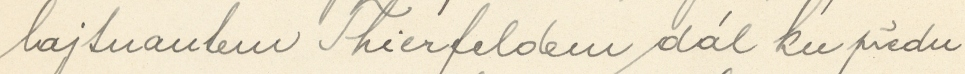lajtnantem Thierfeldem dál ku předu
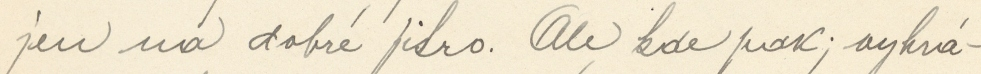jen na dobré jitro. Ale kde pak; vyhrá-
